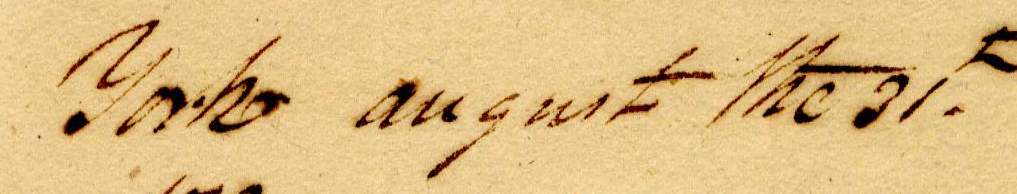York August the 31^st
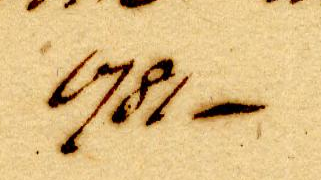1781
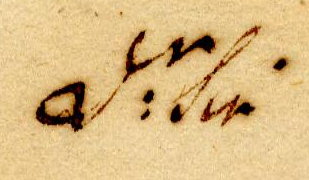D^r Sir
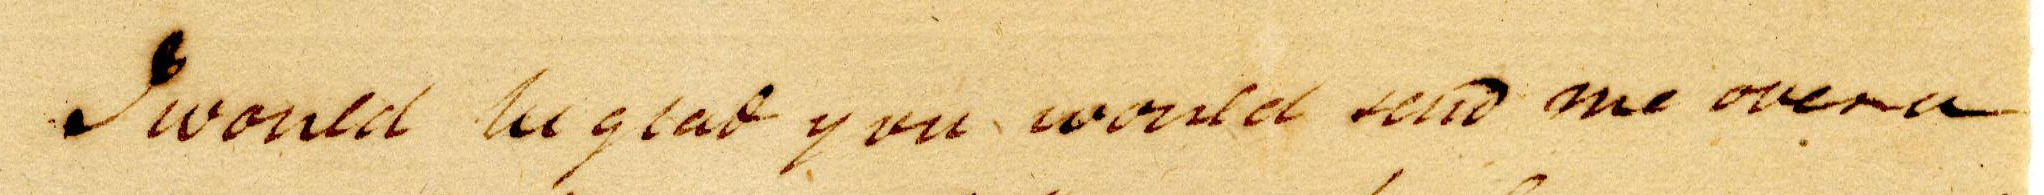I would be glad you would send me over a
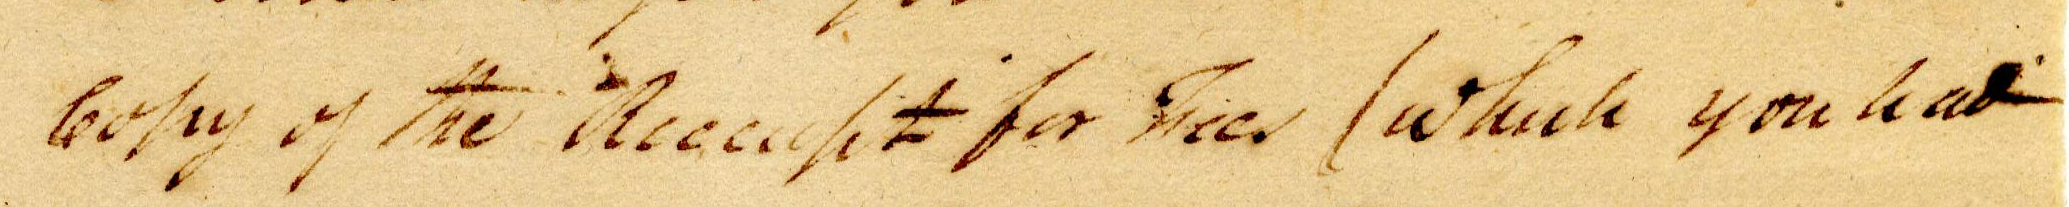Copy of the Receipt for Fees (which you had
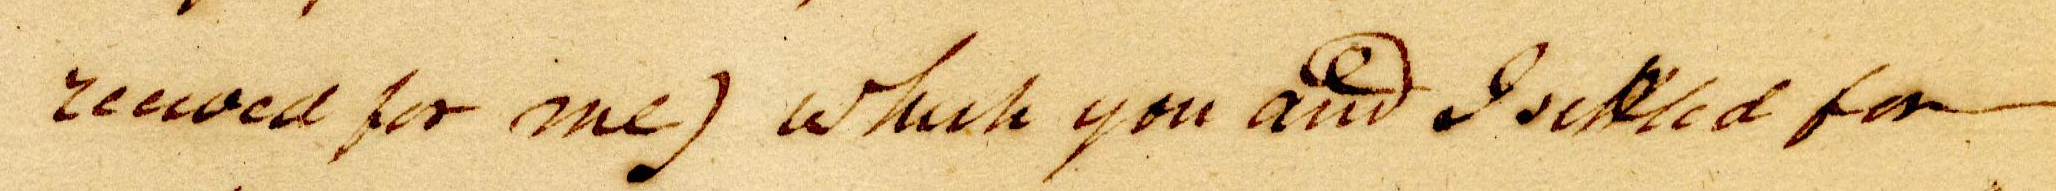received for me) which you and I settled for
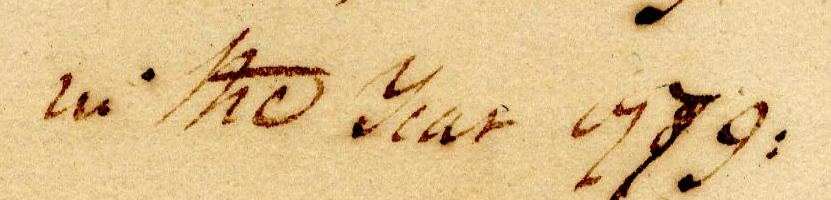in the Year 1779.
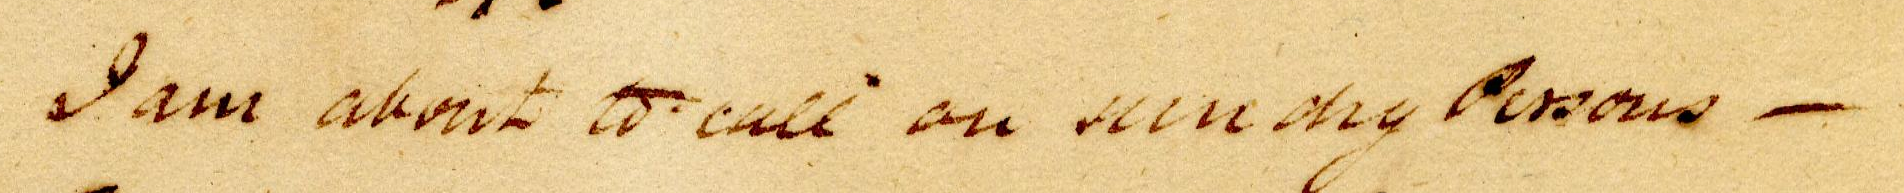I am about to call on seen dry Persons-
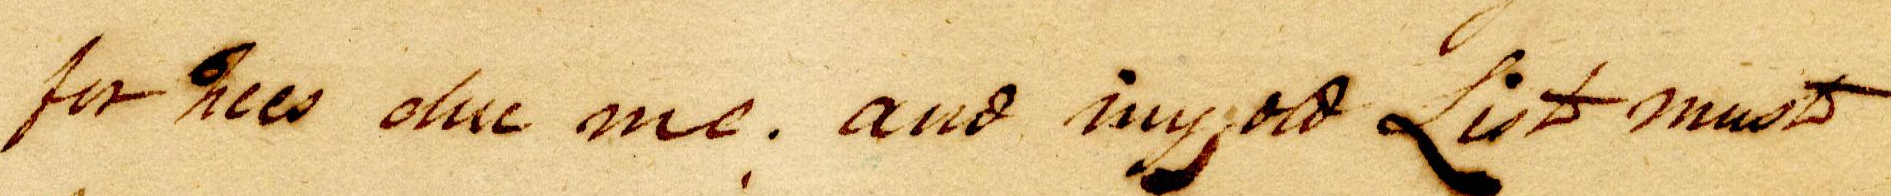for Fees due me. and, my old Lists must
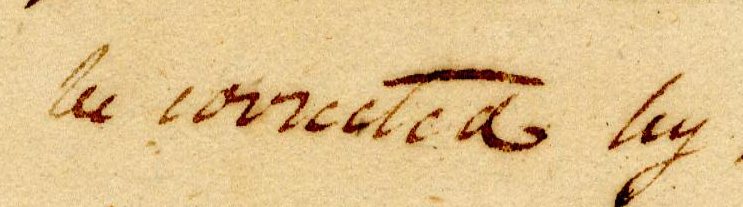be corrected by
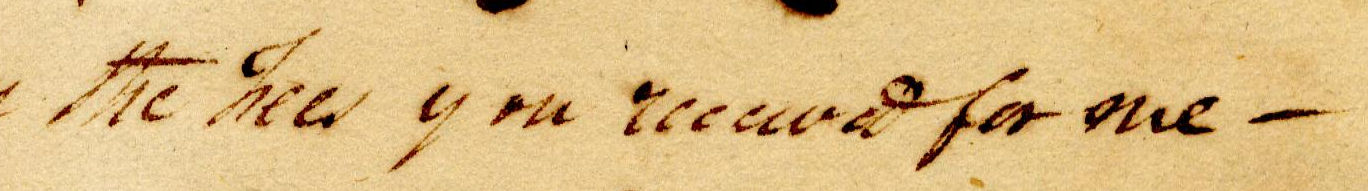the Fees you received for me
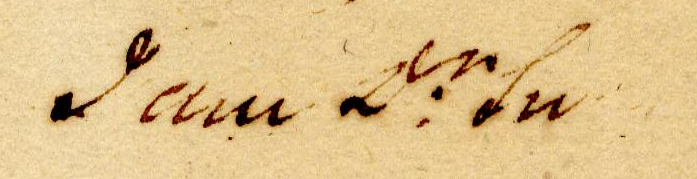I Am D^r Sir
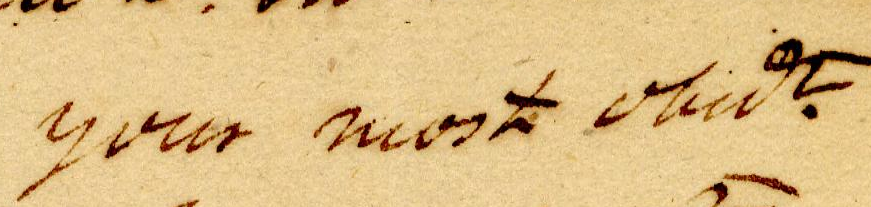your most obed^t
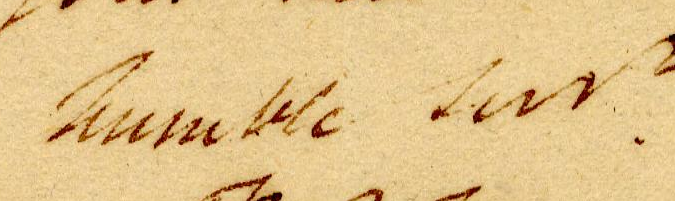humble serv^t
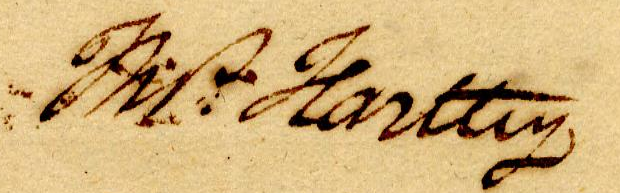M^r. Hartley
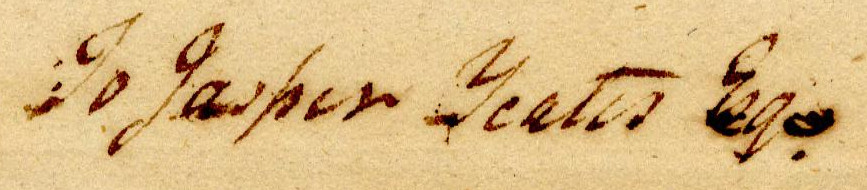To Jasper Yeates Esq.
